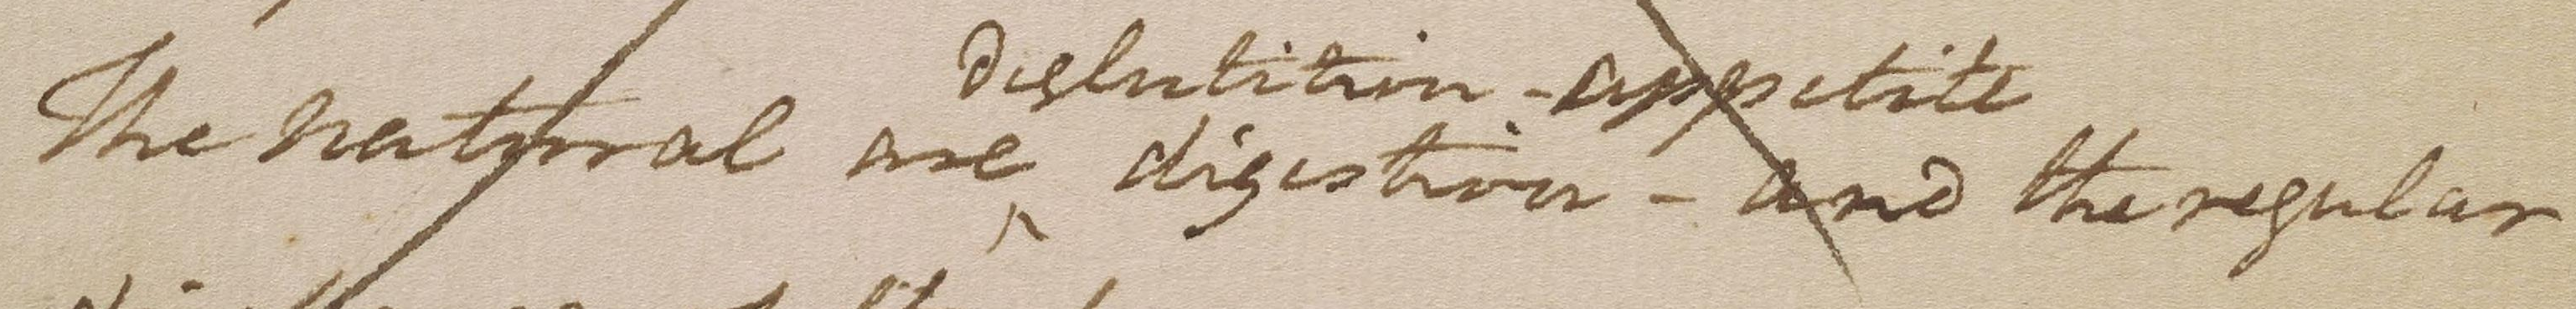The natural are ^ digestion- and the regular
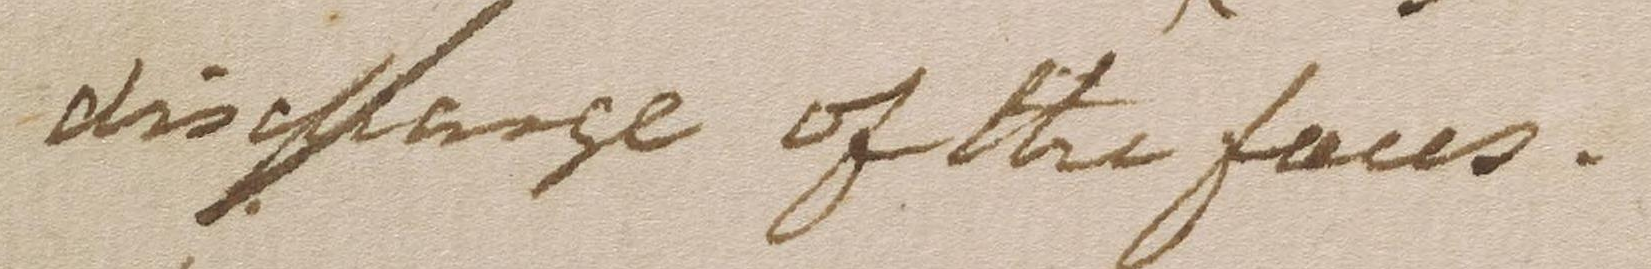discharge of the faeces.
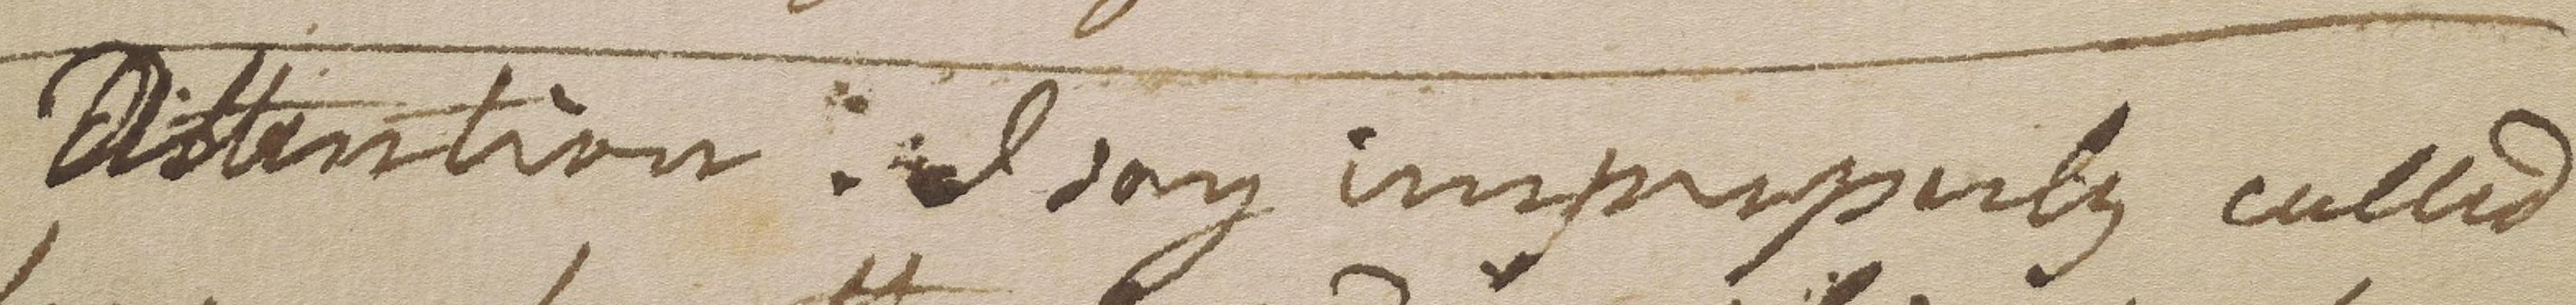Attention: I say improperly called
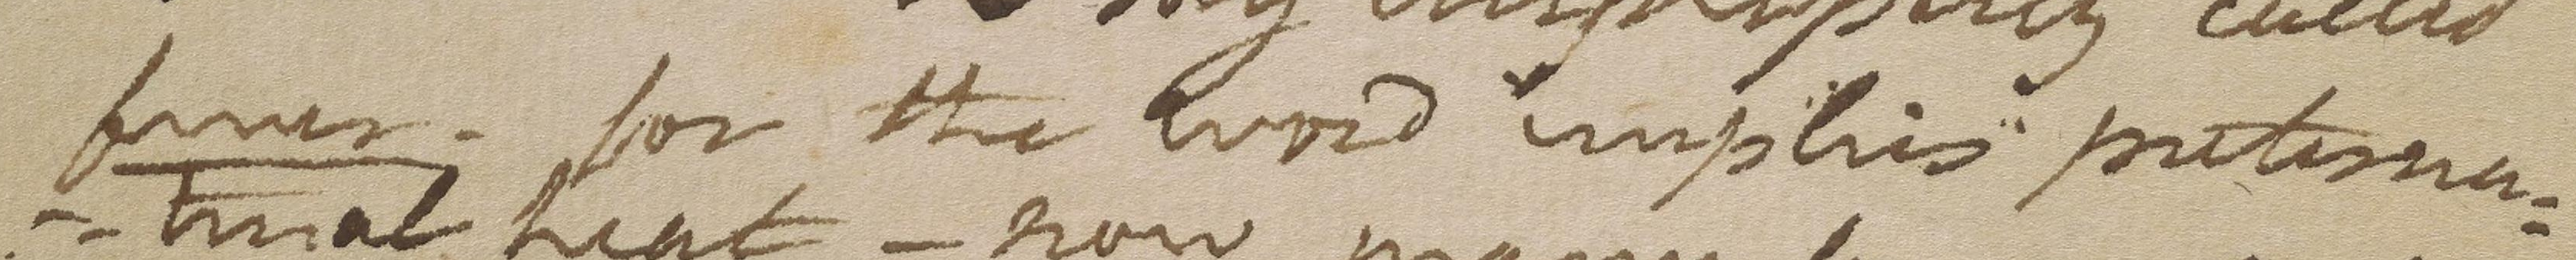fever, for the word implies preterna-
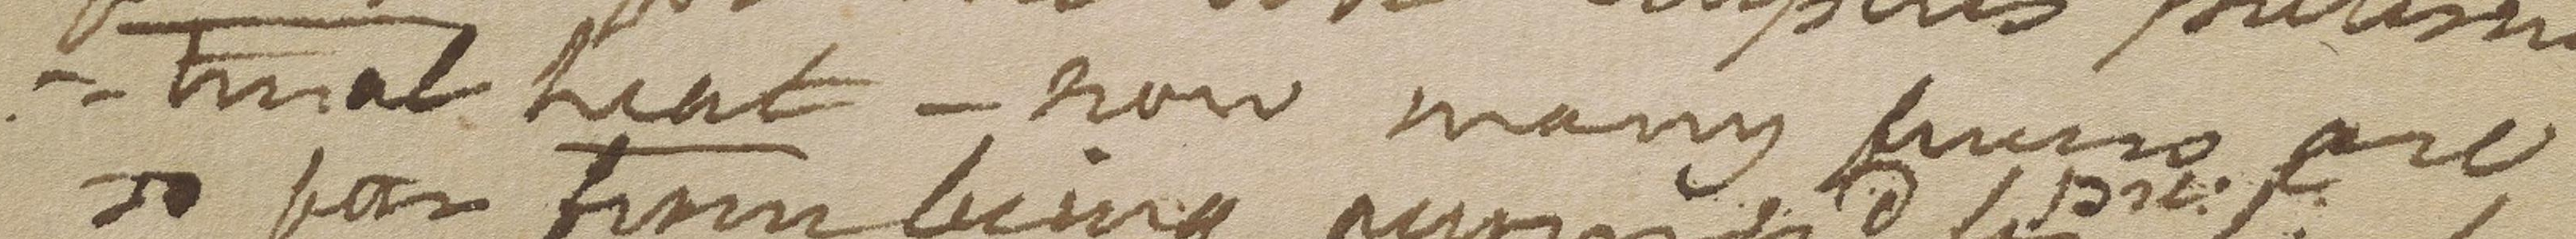-tural heat- now many fevers are
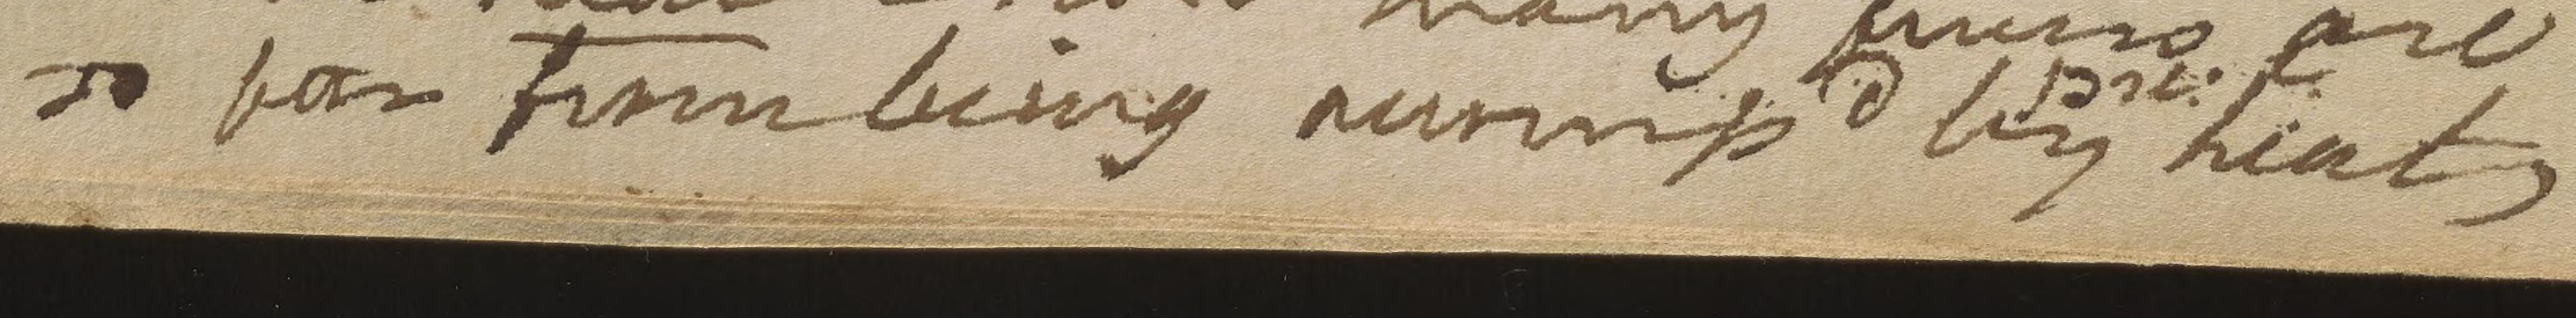so far from being assessed by heat
